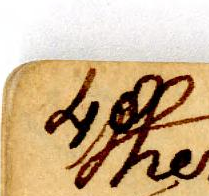48
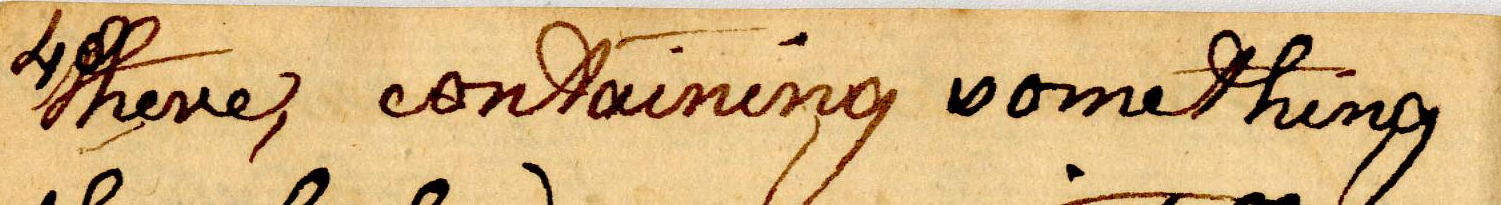there, containing something
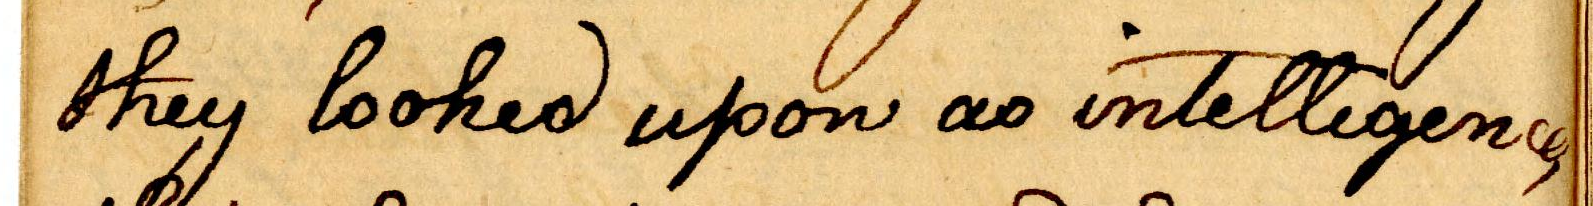they looked upon as intelligence,
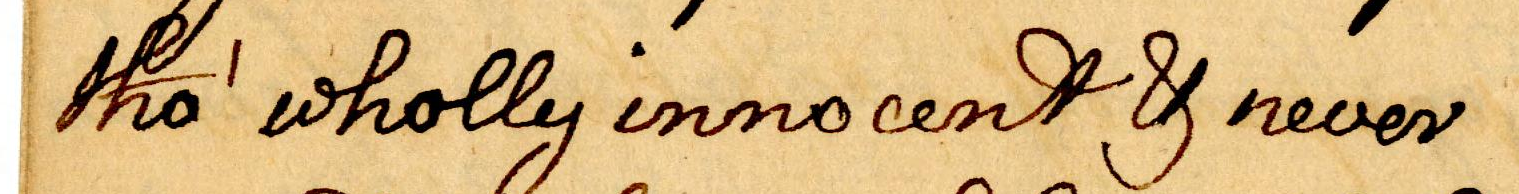tho' wholly innocent & never
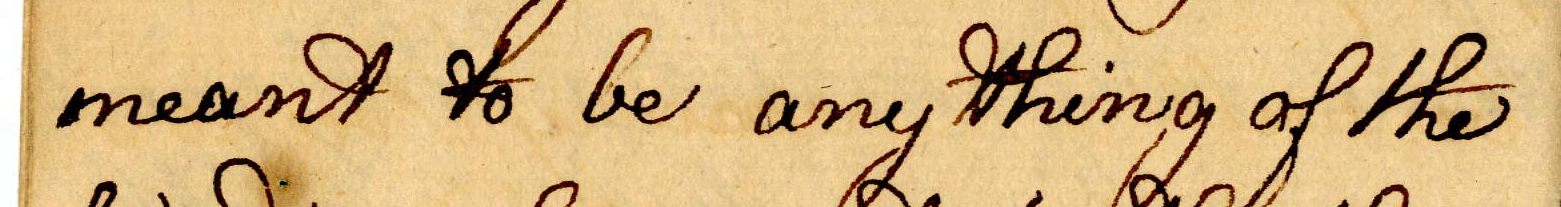meant to be any thing of the
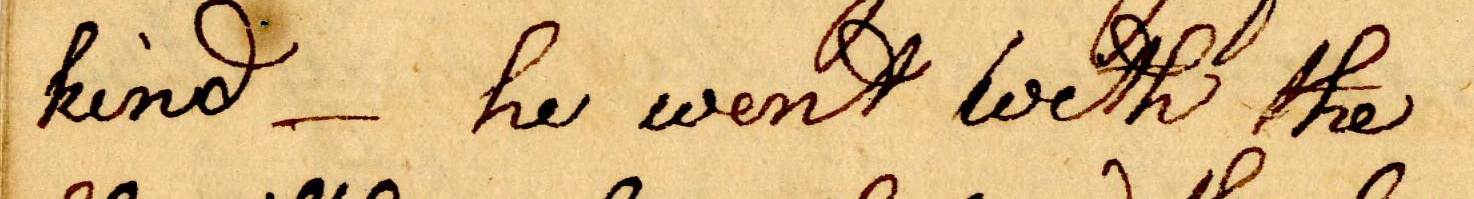kind- he went with the
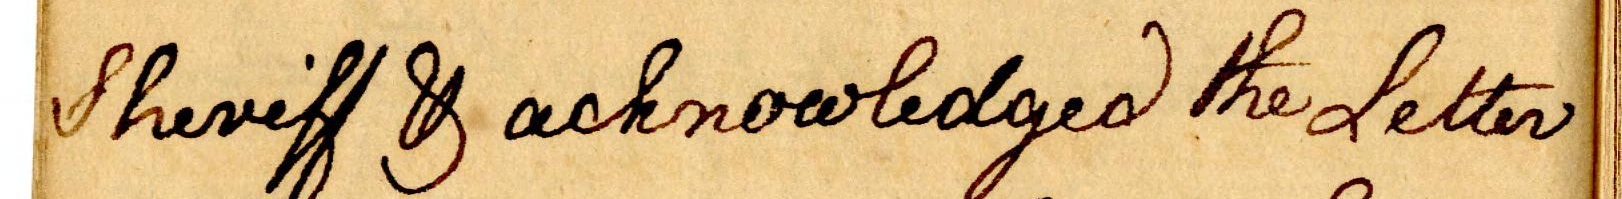Sheriff & acknowledged the Letter
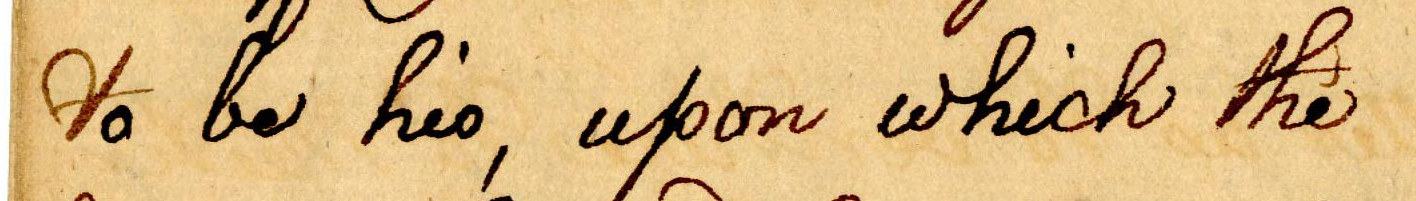to be his, upon which the
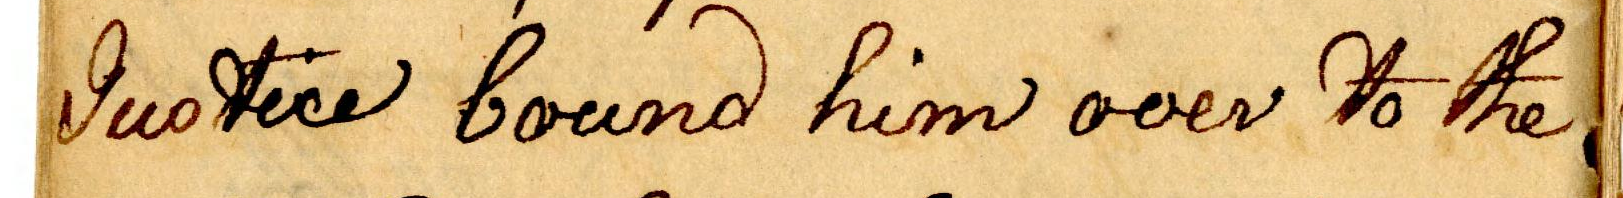Justice bound him over to the
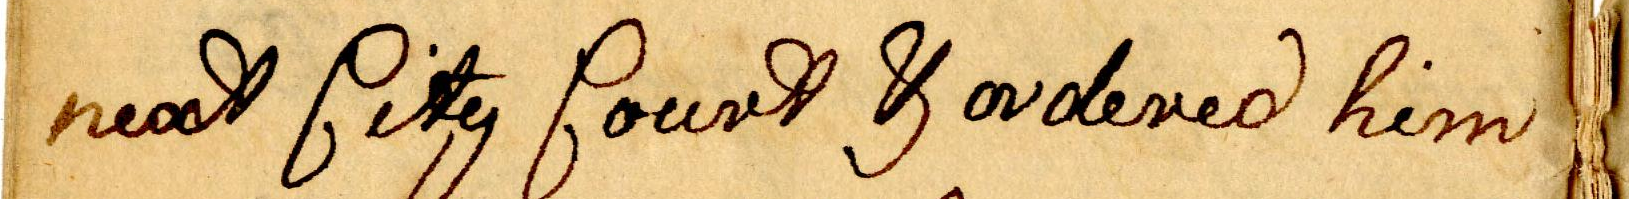next City Court & ordered him
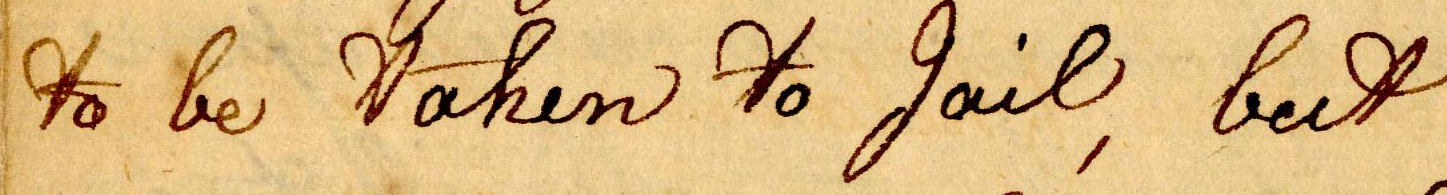to be taken to Jail, but
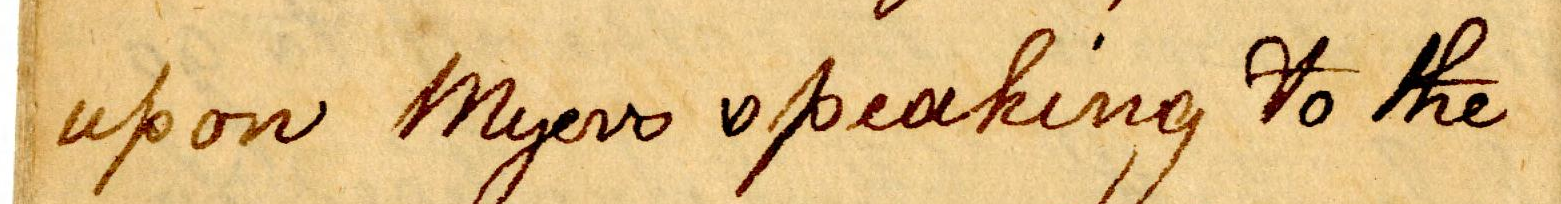upon Myers speaking to the
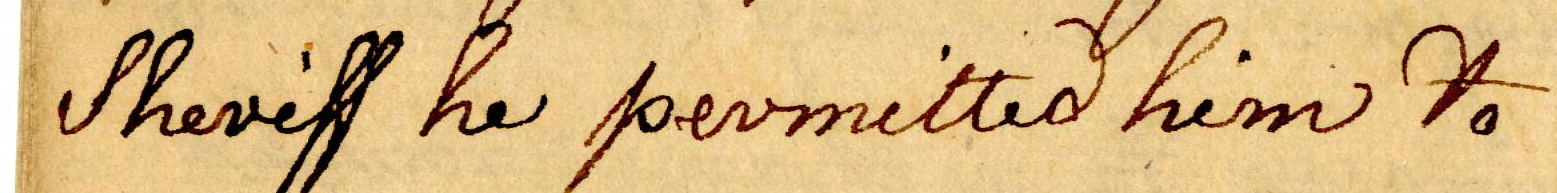Sheriff he permitted him to
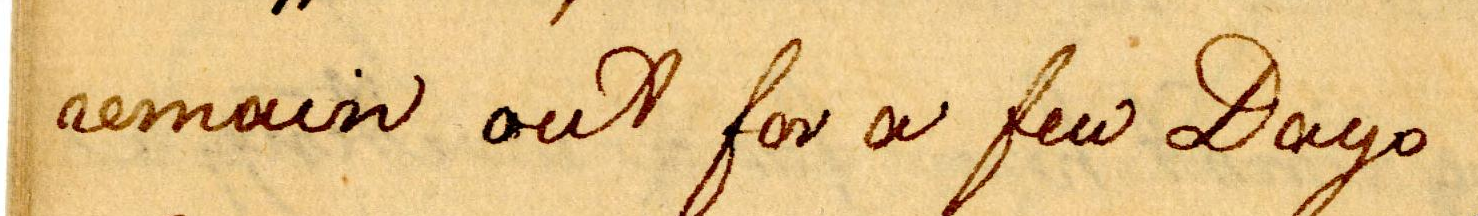remain out for a few Days
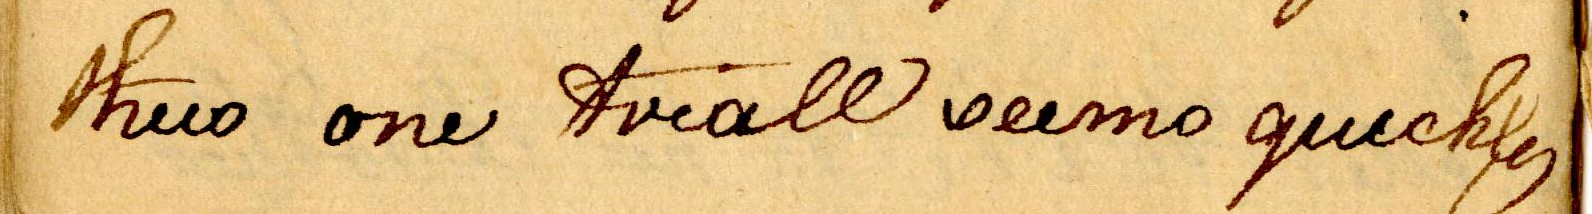thus one triall seems quickly
